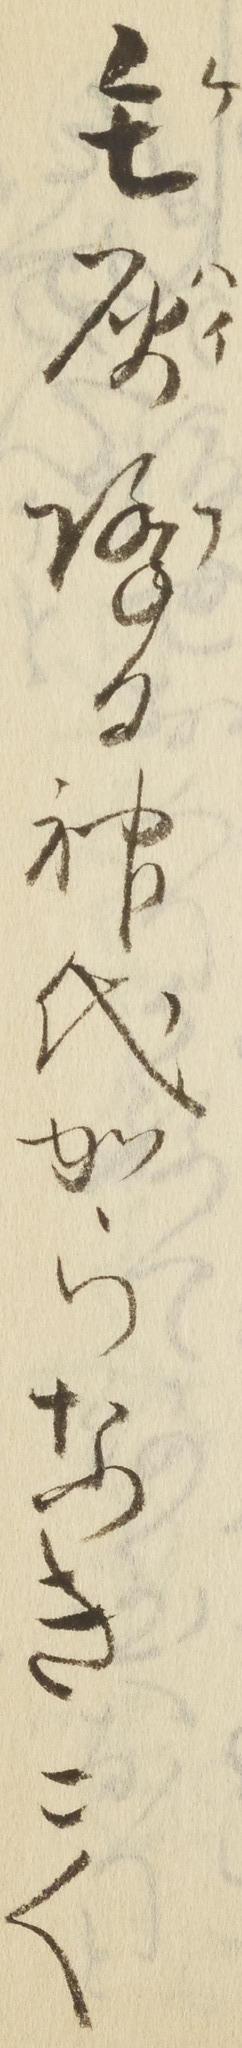「毛灰降る神代からなきこく
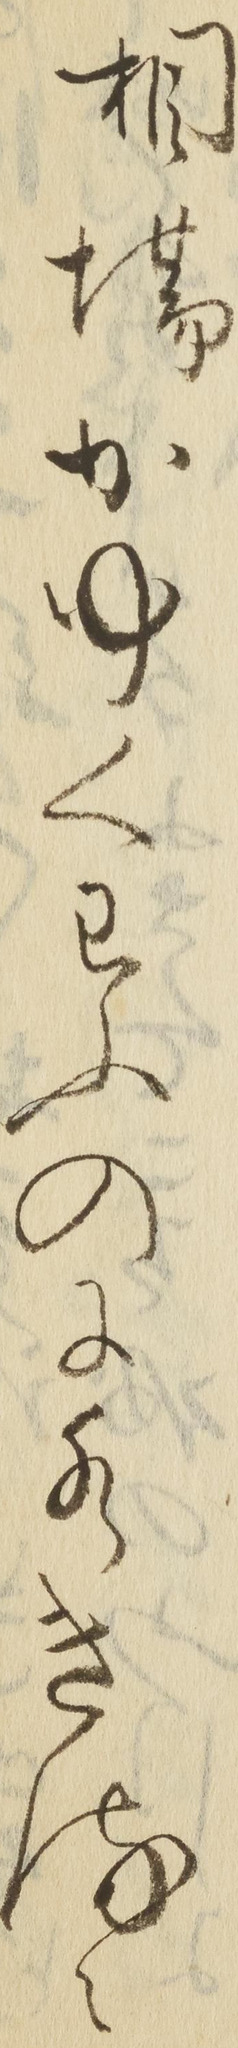相場かゆくわふのに水きるゝトハ

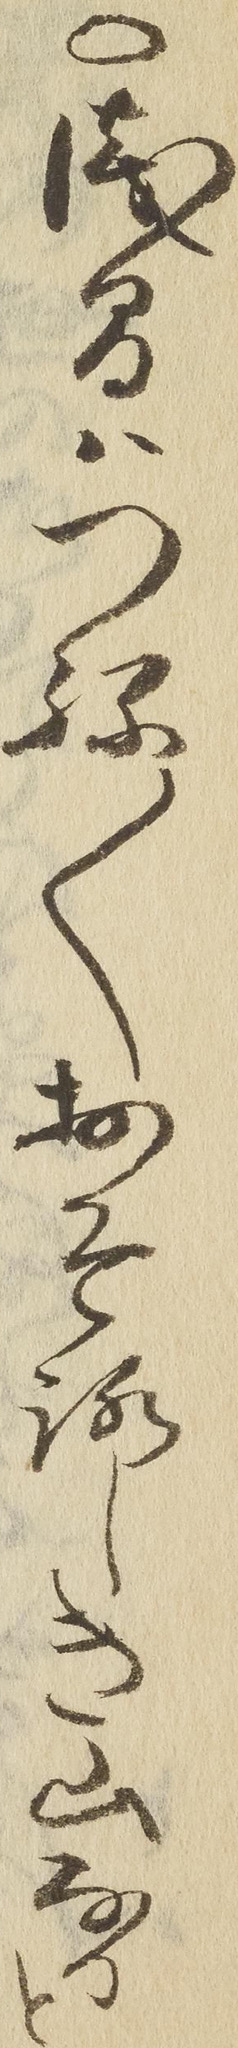◯浅間はつね〳〵おそろしき山なると
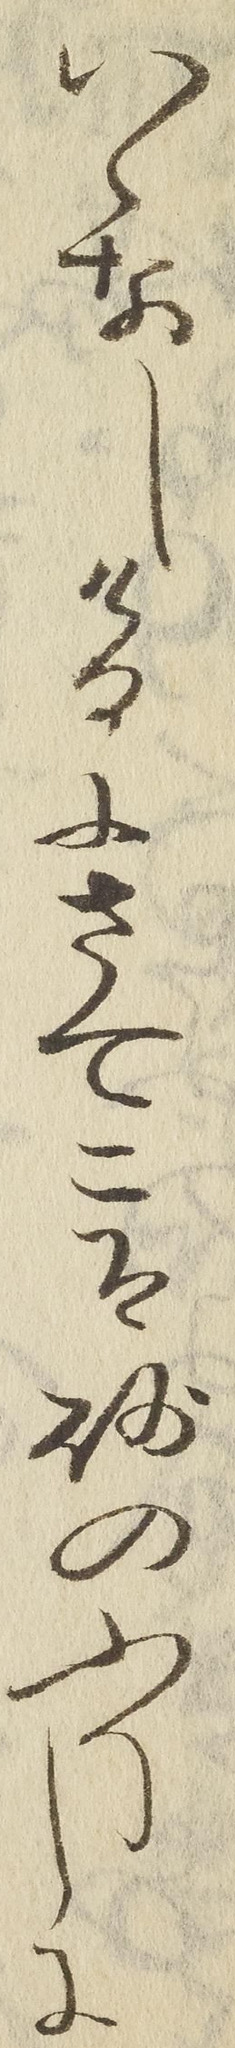いゝなしけるにさてこそ砂のふりしに
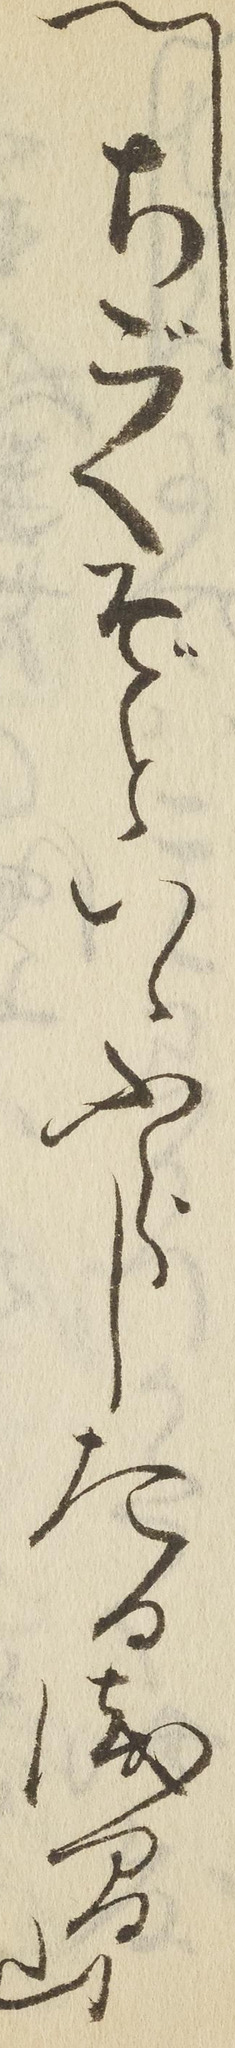「ちごくぞといゝふらしたる浅間山
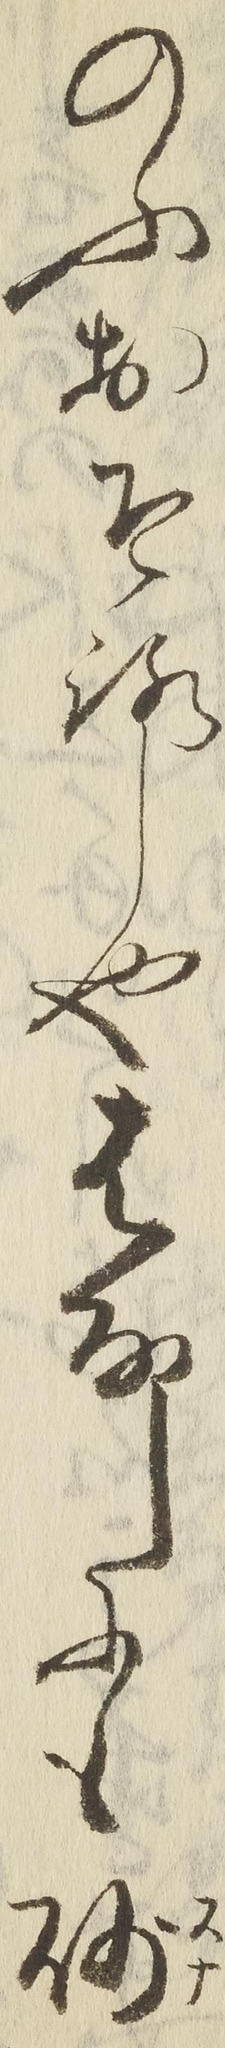のふおそろしやはなしにも砂
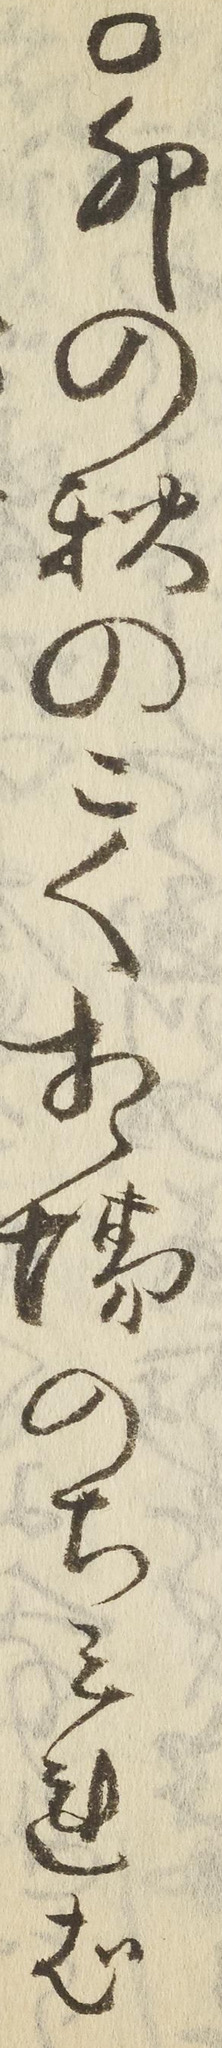◯卯の秋のこく相場のちみれば
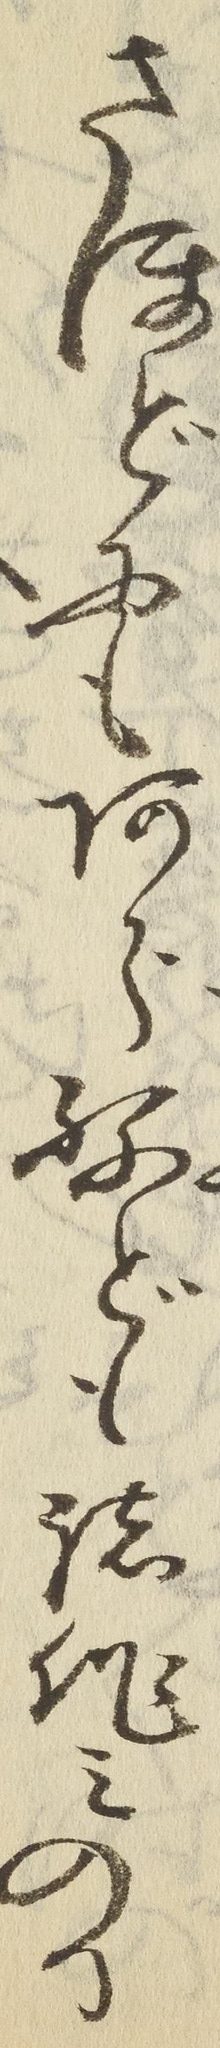さほどにもあらねど諸作みのり
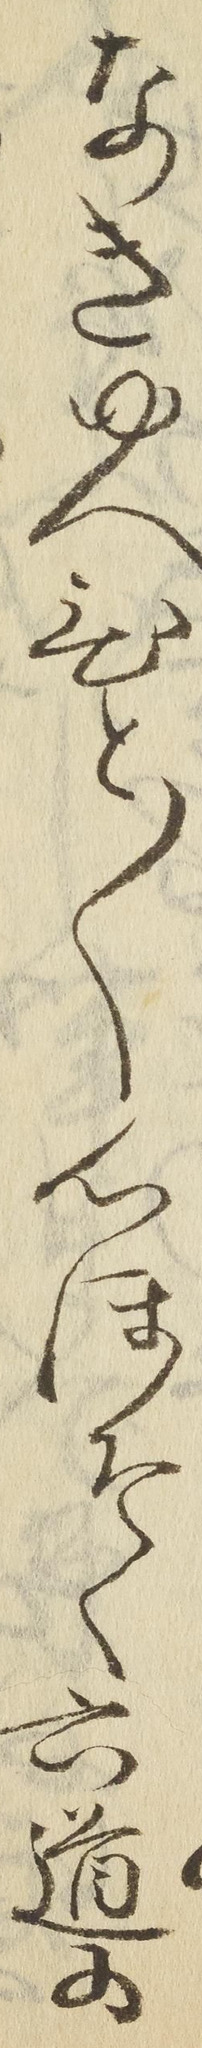なきゆへひと〴〵心ほそく六道に
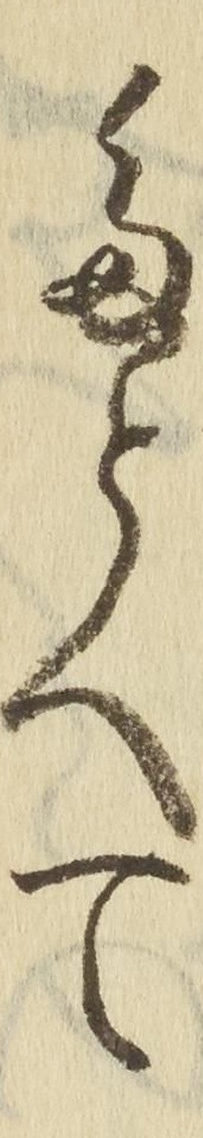たとへて
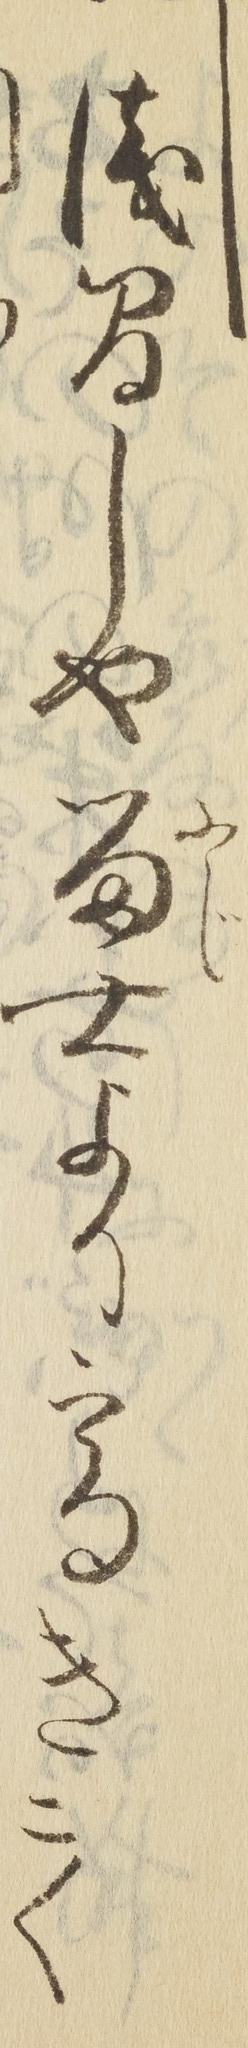「浅間しや富士より高きこく
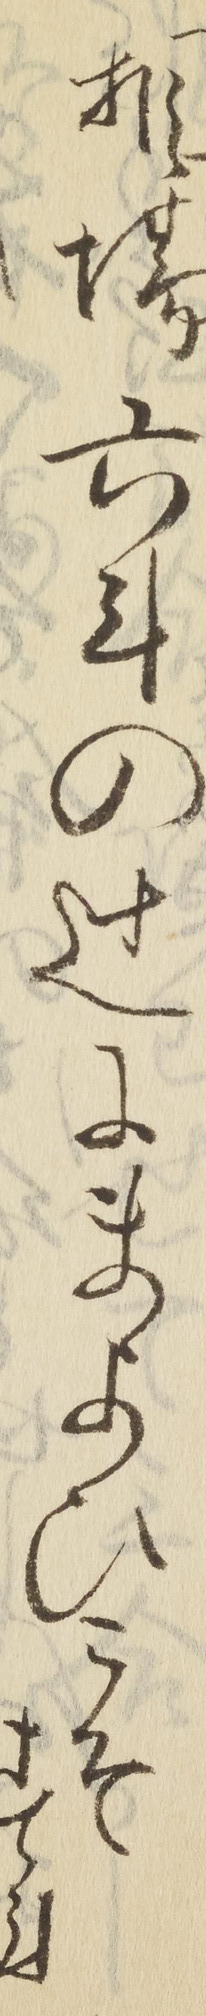相場六斗の辻にまよひこそすれ
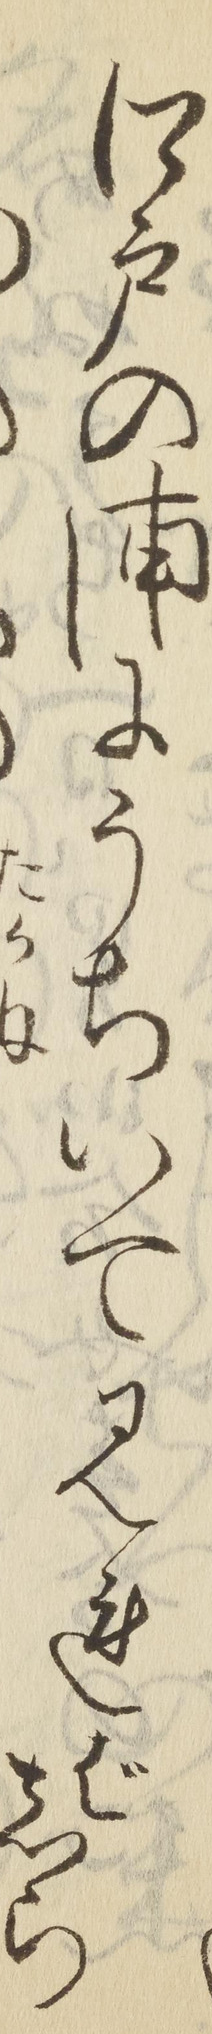「江戸の浦にうちいで見ればしら
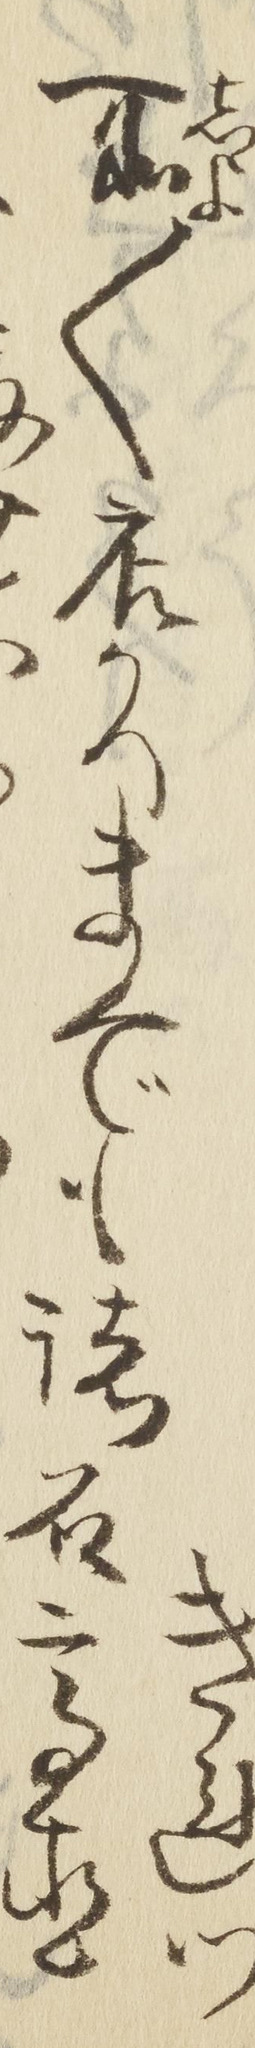所〳〵店かりまでも諸石高直
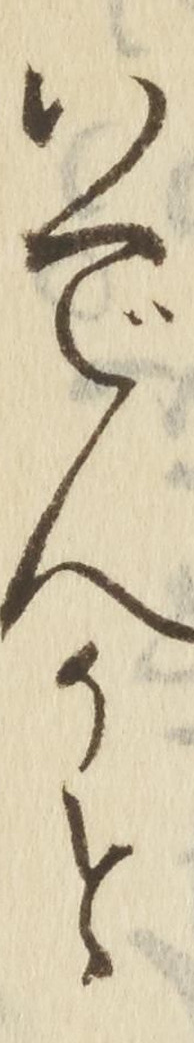いでんかと
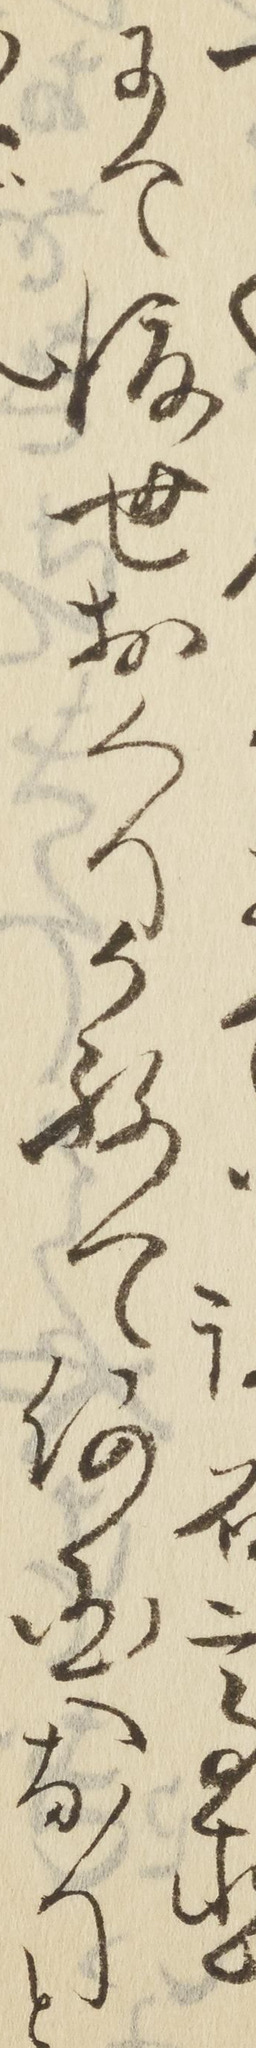にて渡世おくりかねて何国へなりと
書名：浅間大變記
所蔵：東京大学地震研究所図書室 Earthquake Research Institute Library, The University of Tokyo, JAPAN
